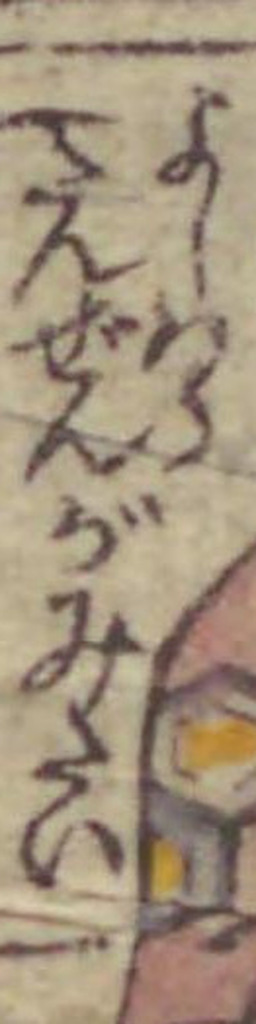たんぜんがみたい
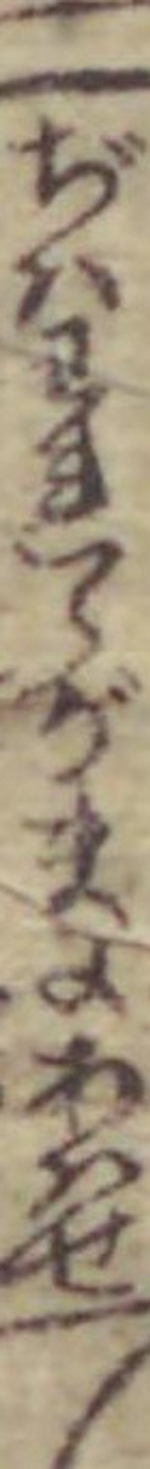ぢはわれらがまにあはせ
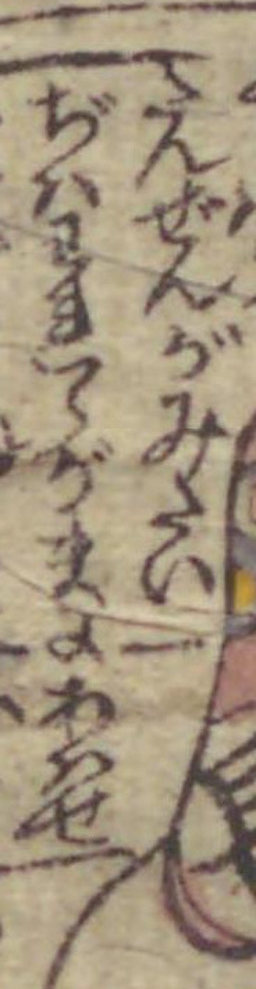ぢはわれらがまにあはせ
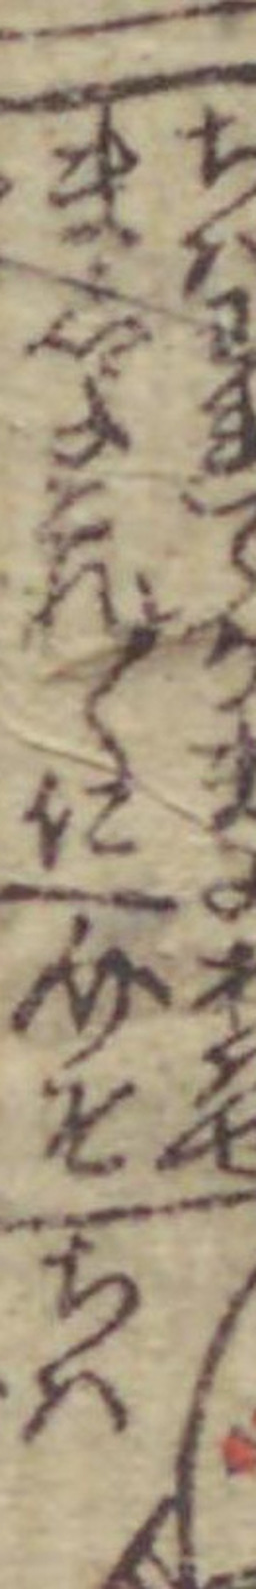ましよこれ〳〵仁介そちは
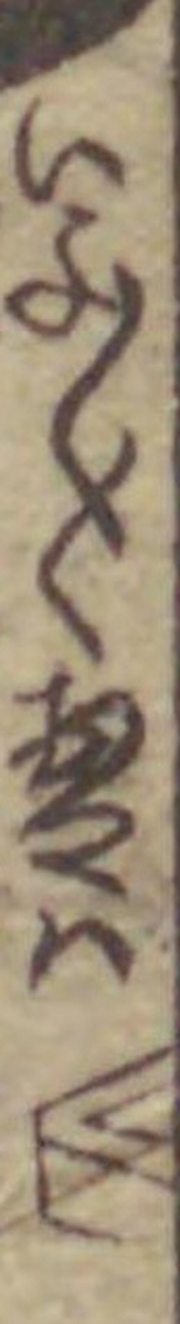いよ〳〵〳〵扨やは
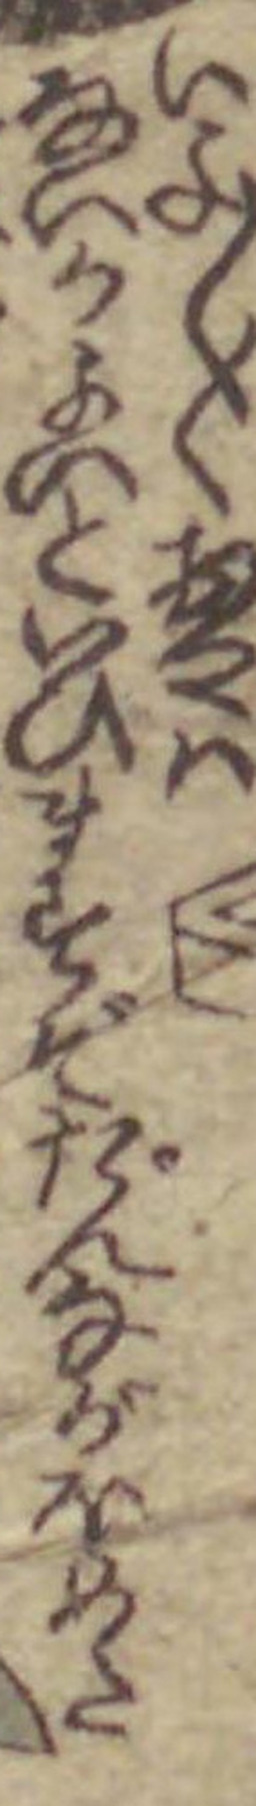ないかよいといひますぞだんながほめた
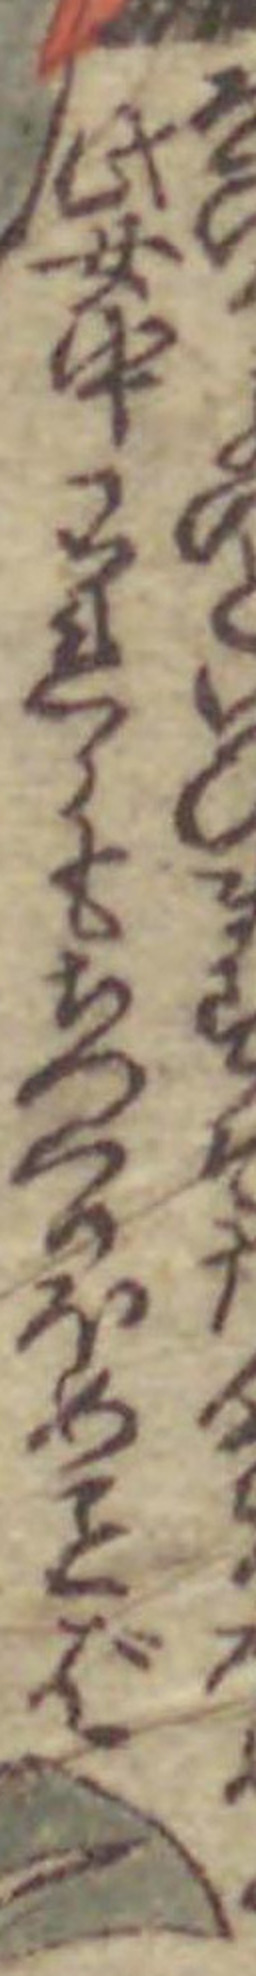此女中われらもちつくりほめことば
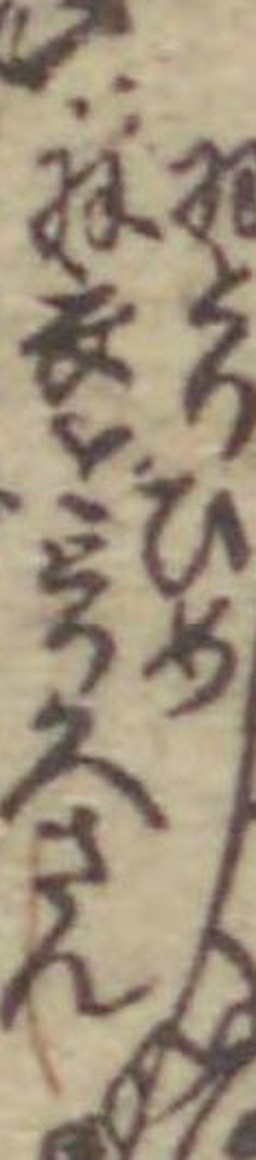羽衣をとりかへさん
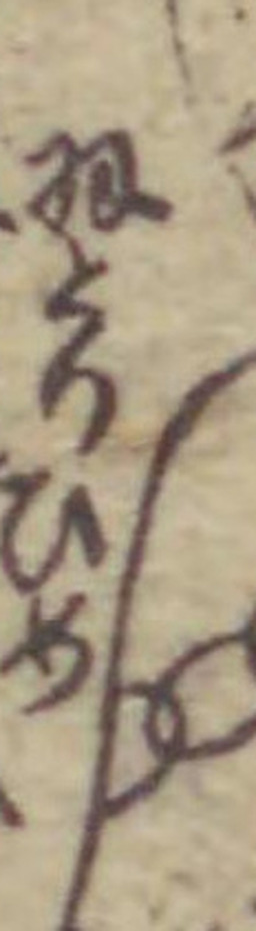羽とりひめ
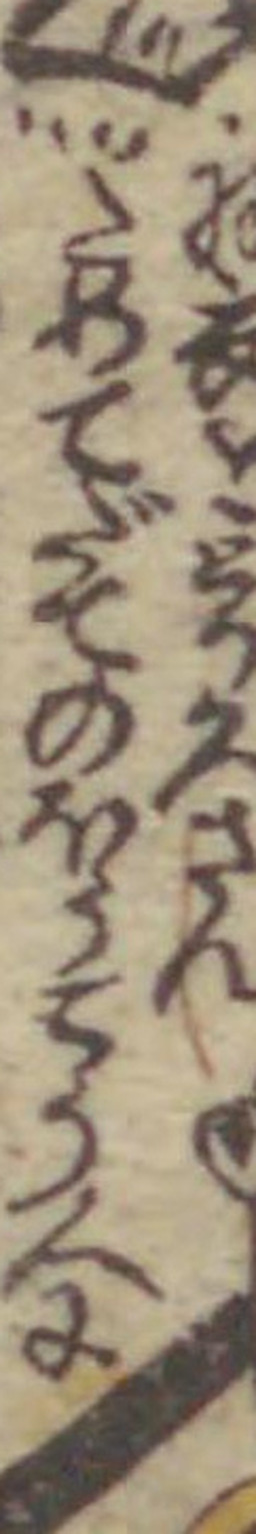ためてだてのほうこう人に
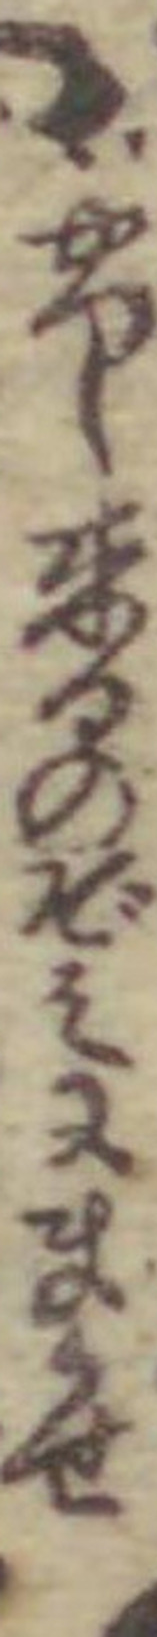やつし来るのぞみにまかせ
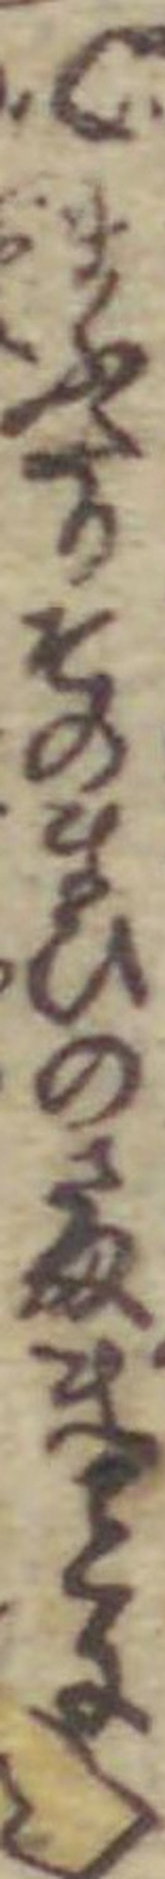まふたりそのまひのさままことに
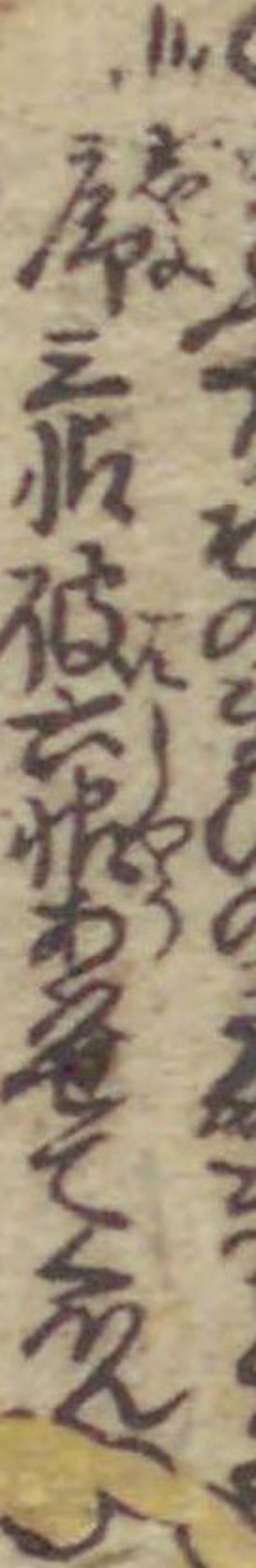序三帖破六帖あはせてくほん
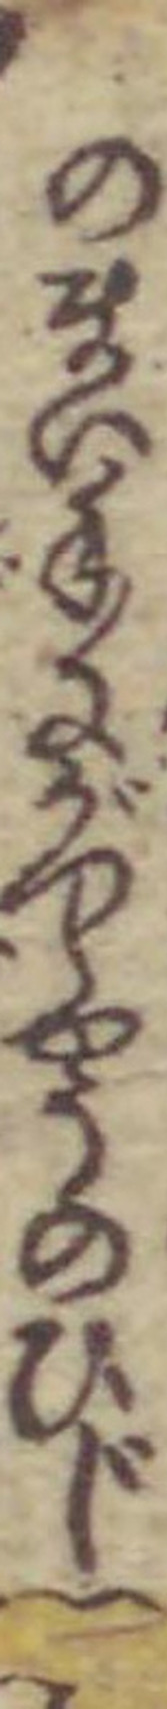のまい手にがつしやうのひじ
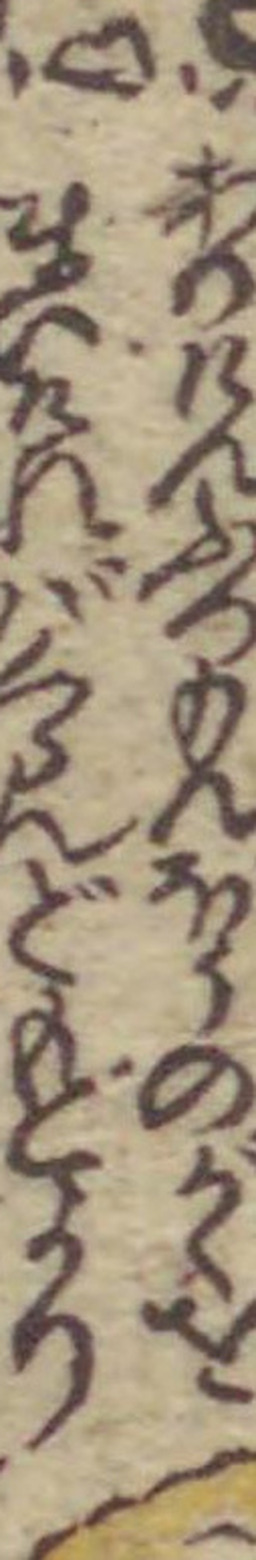まいければくらんどもとより
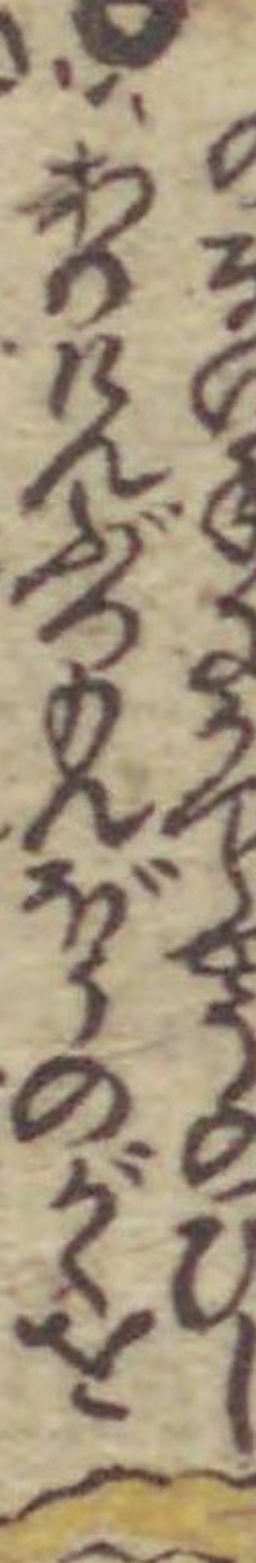ありけんぶつもんぼうのがくを
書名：娜二代鉢木 5巻
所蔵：国立国会図書館 National Diet Library, JAPAN
